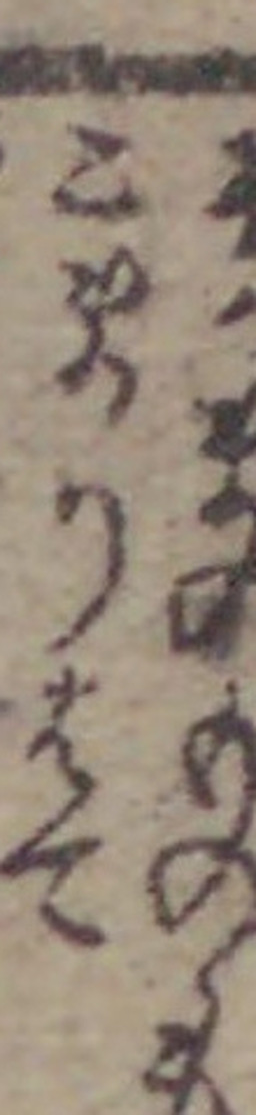こまりはて
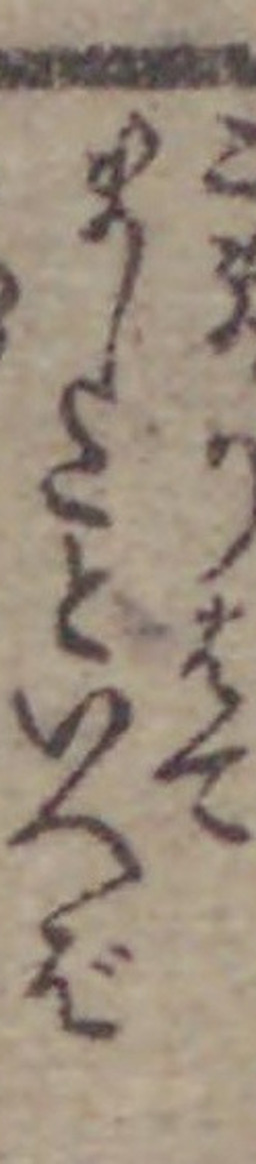ましたといへば
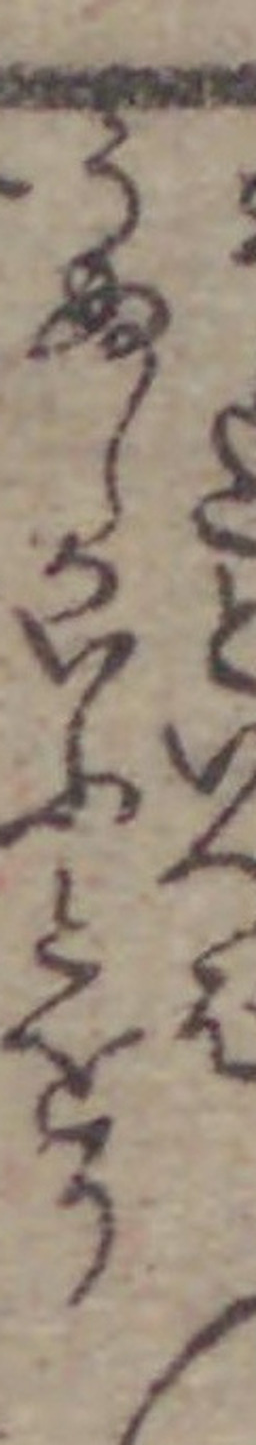うぬしかいふとをり
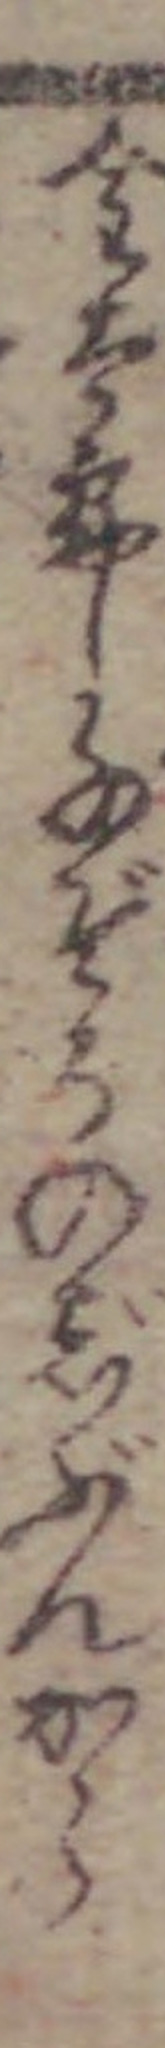金太郎子ぞうのじぶんから
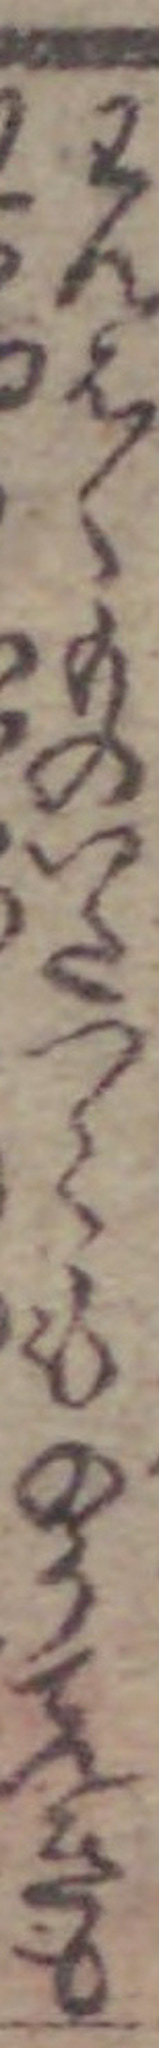わんはくものいたつらものうてんきも
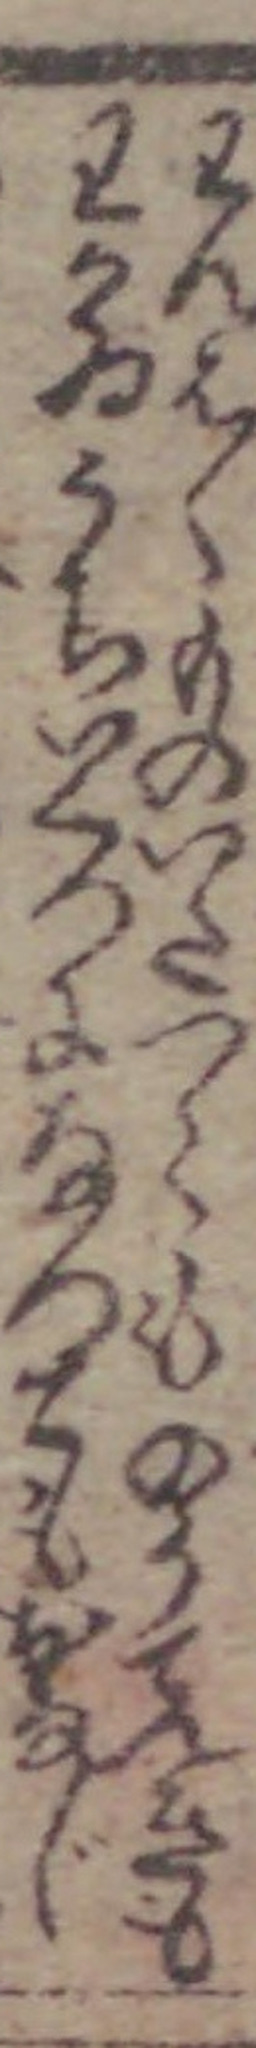わかゐうちいくつになつてもおなじ
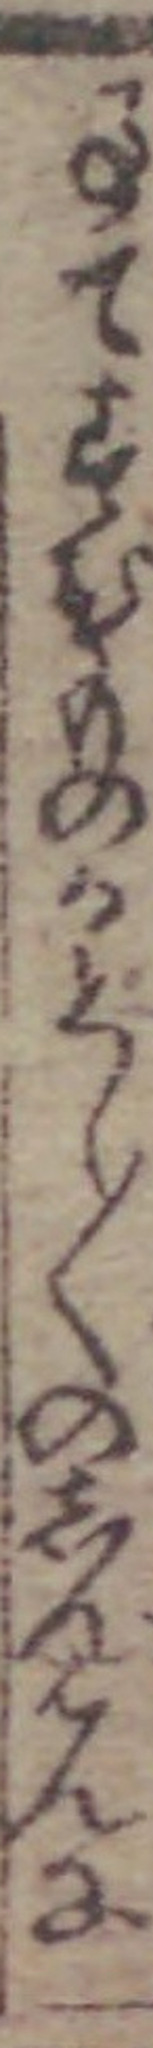事てすむものかどし〳〵のしんはんに
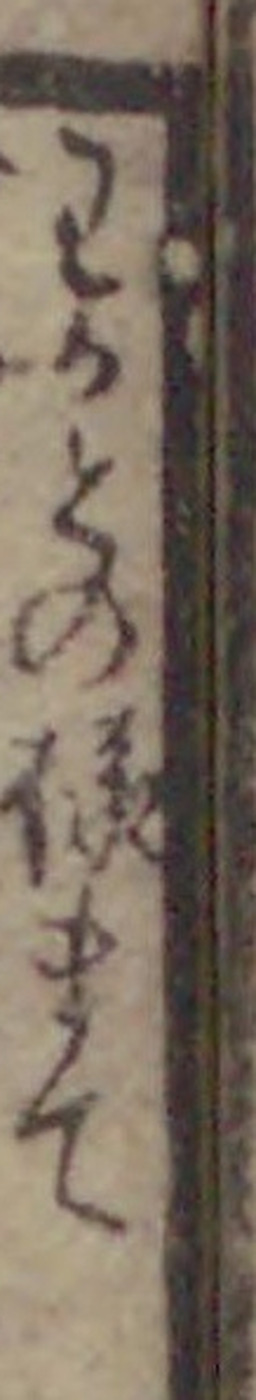わかとの様まて
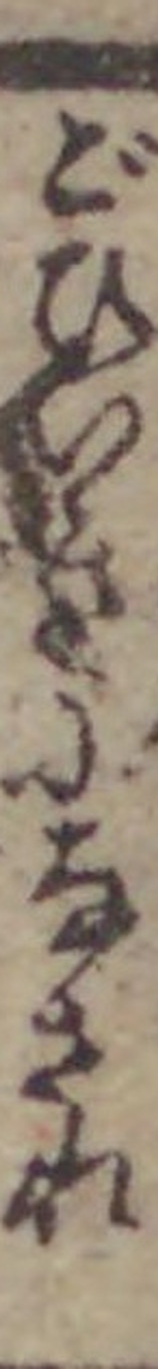ごひいきになされ
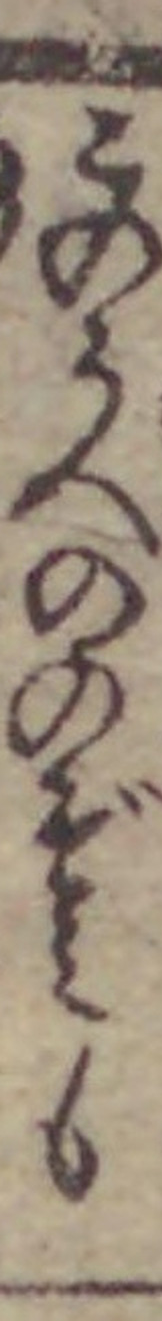このうへののぞみも
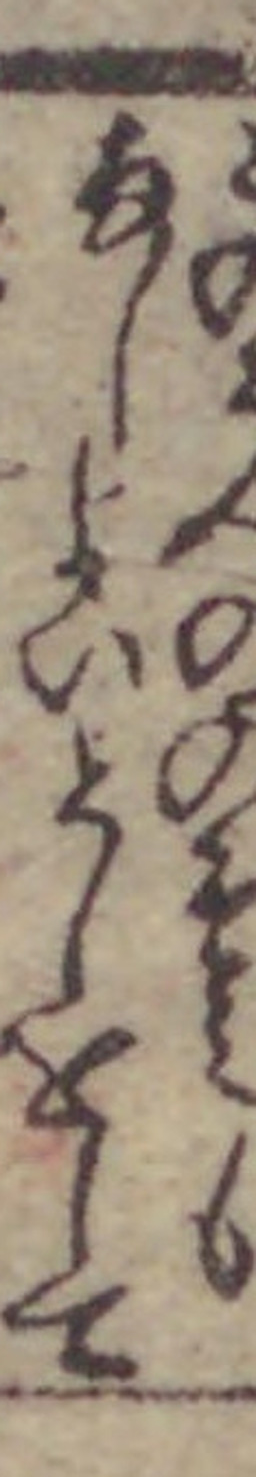なしよいとしをして
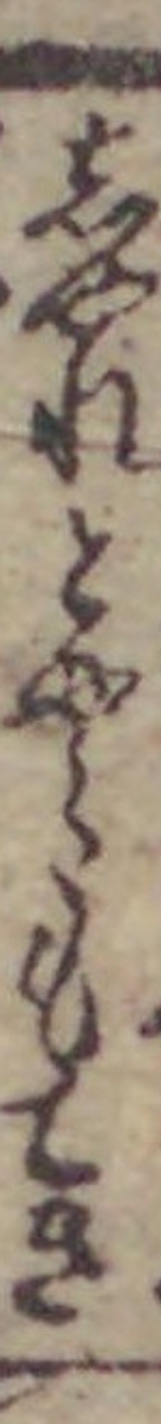しやれとやらもてき
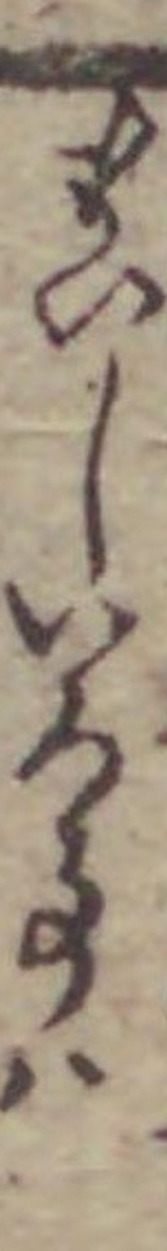まいしいろ事は
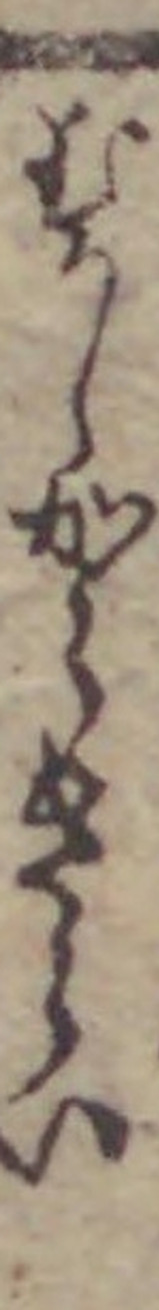むかしからきらい
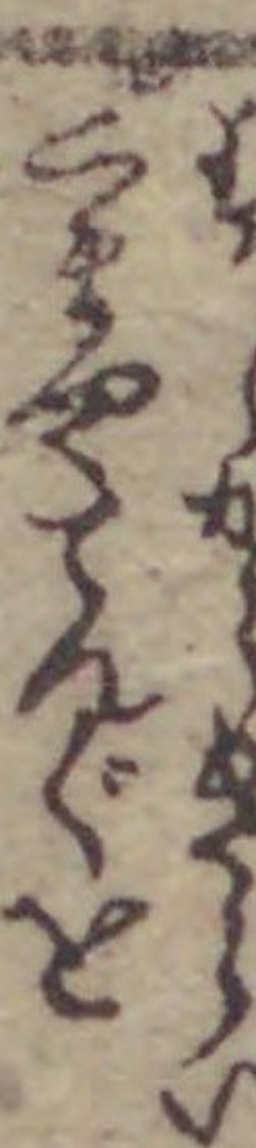くまやてんぐを
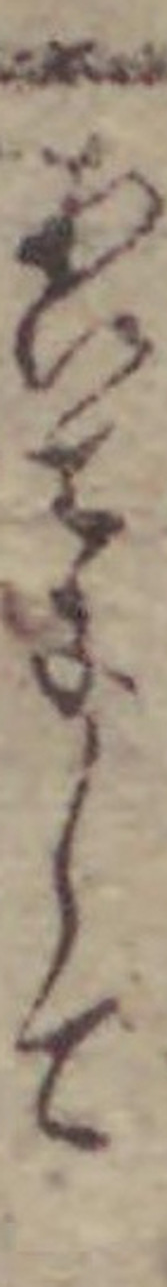あいてにして
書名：化物鼻がひしげ 2巻
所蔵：国立国会図書館 National Diet Library, JAPAN
